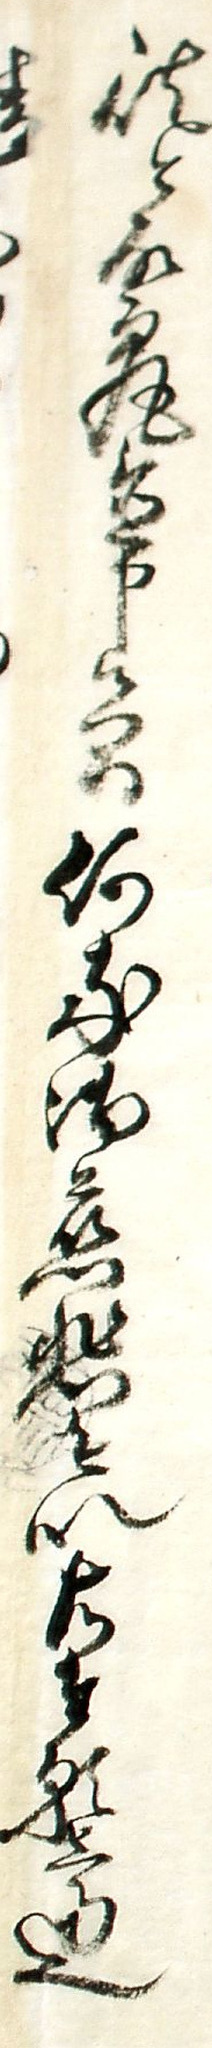屹と取究置申候間何卒御慈悲を以右奉願上通
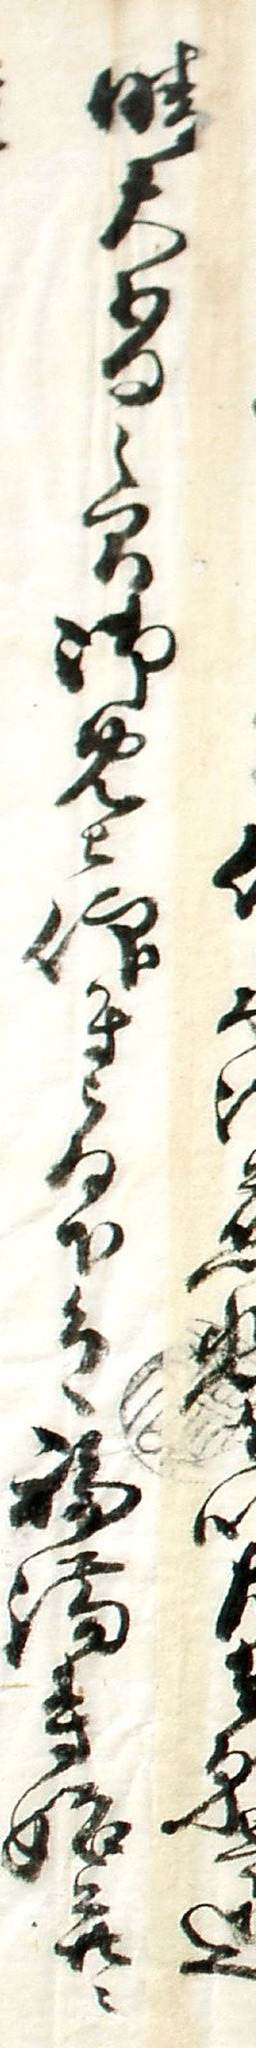晴天五日之間御免被仰付被為下候ハヽ福満寺始幷ニ
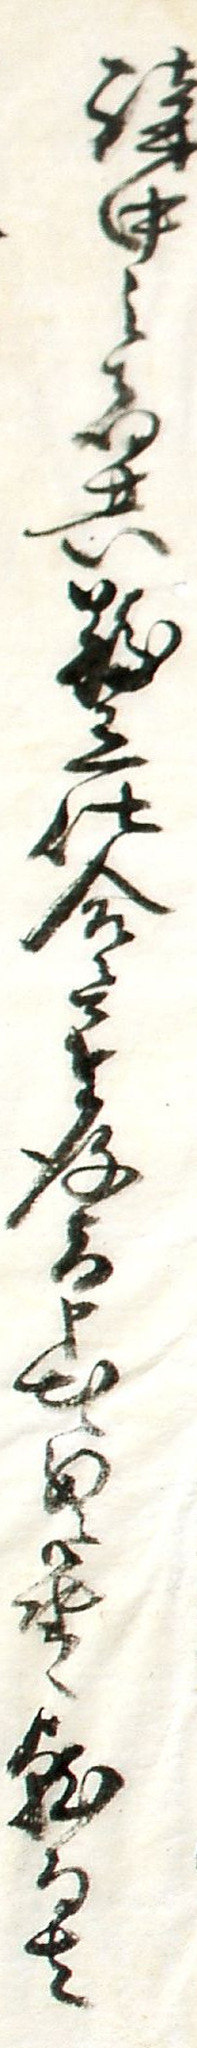講中之者共難有仕合ニ可奉存旨申出候義ニ御坐候就而者
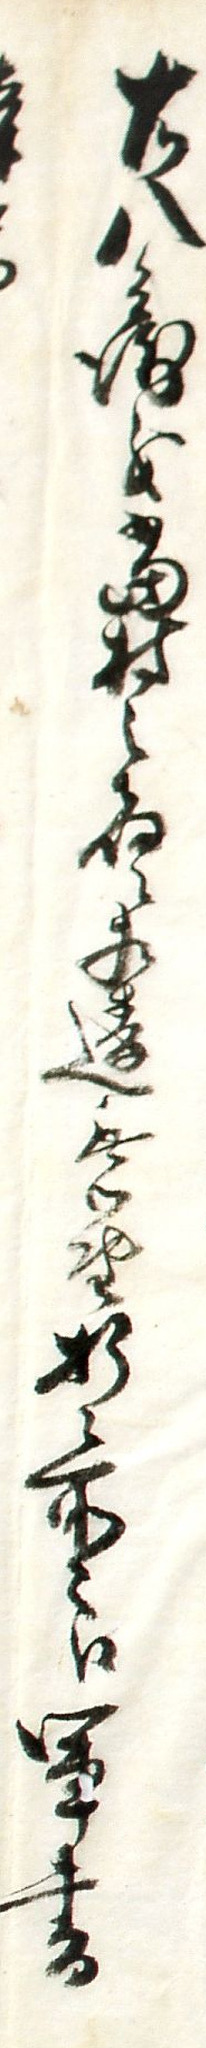右八兵衛義當村之者ニ相違無御坐折々所々江軍書
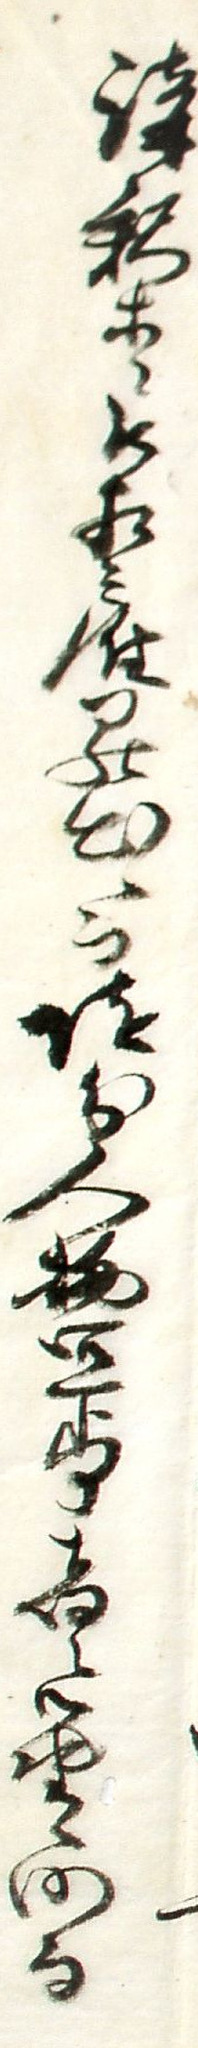講釈等ニ被相雇罷出候而随分人柄宜布者ニ御坐候仍而
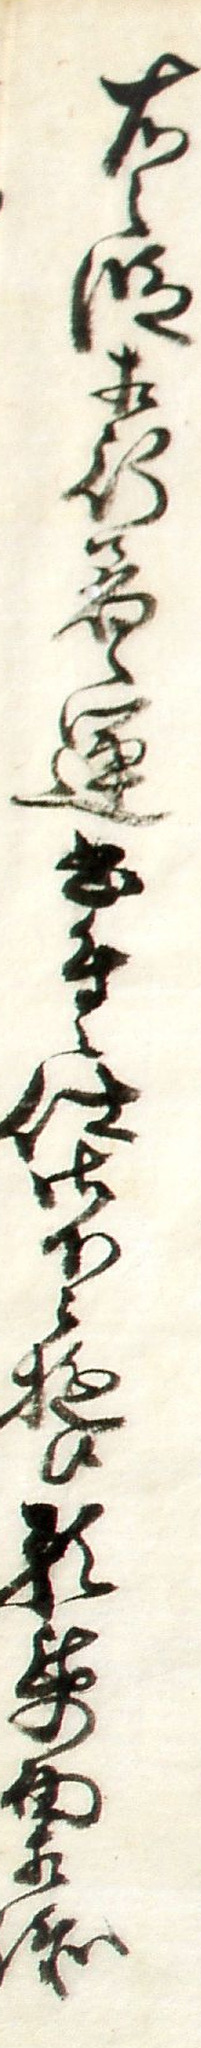右之段相行着候運書付ニ仕御下被遊候願紙面相添

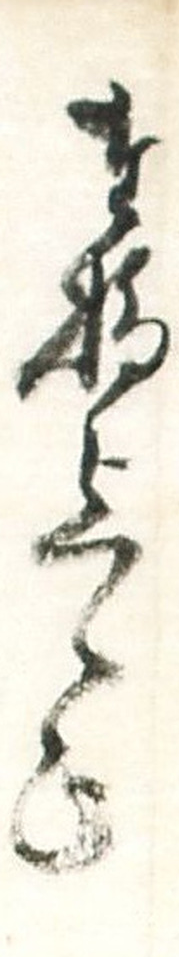奉指上候以上
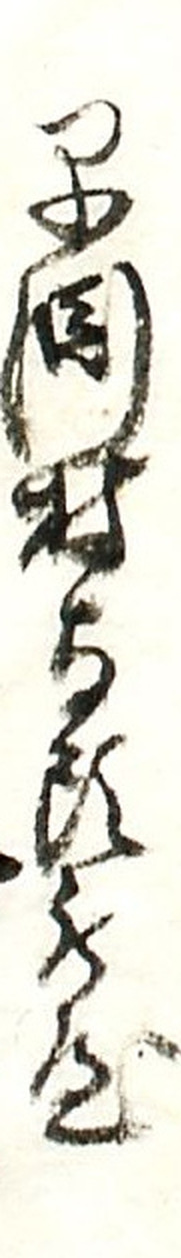早渕村与頭庄屋
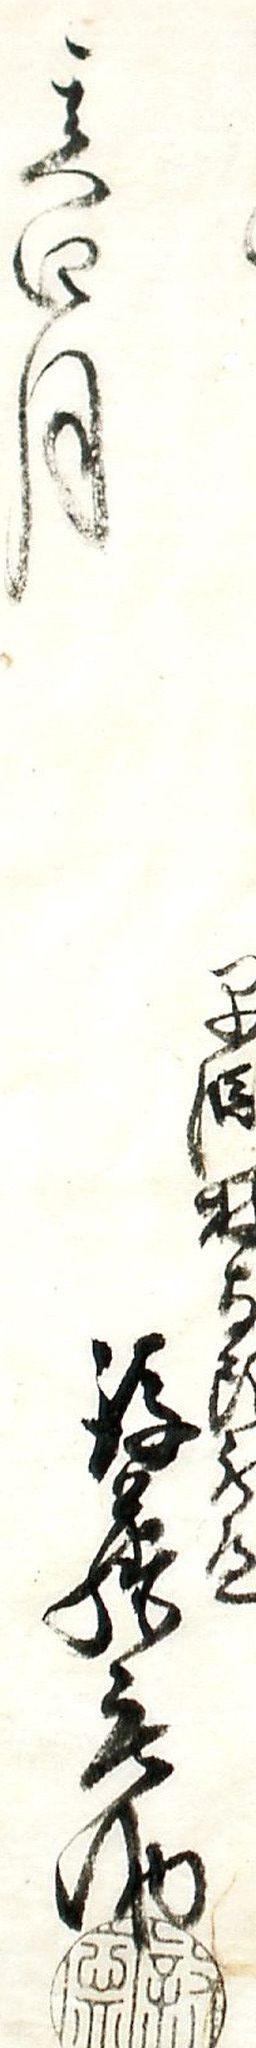亥四月後藤庄助
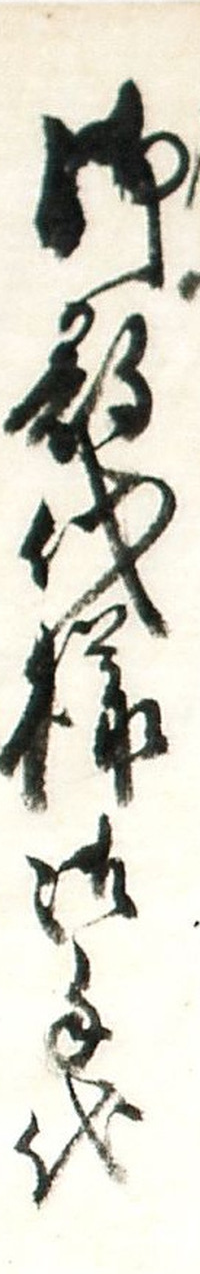御郡代様御手代
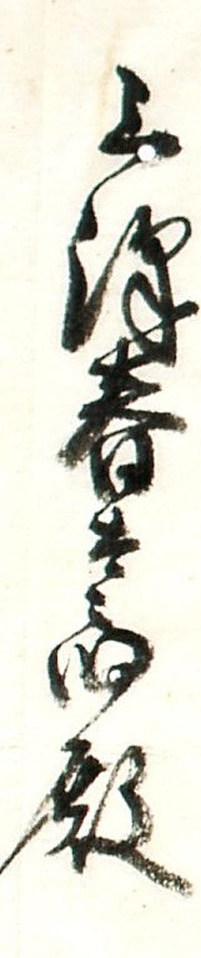三澤春太郎殿
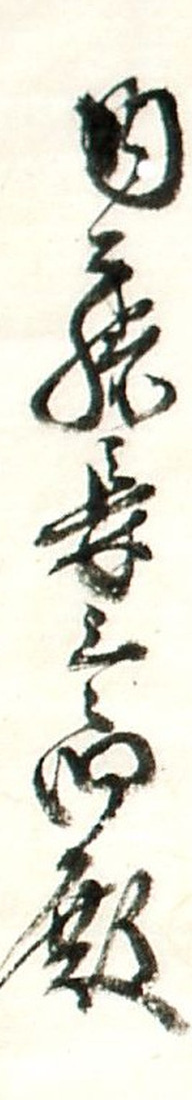内藤長三郎殿
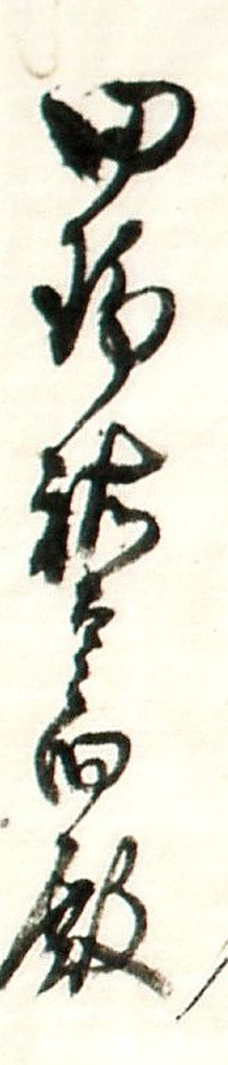田野祐太郎殿
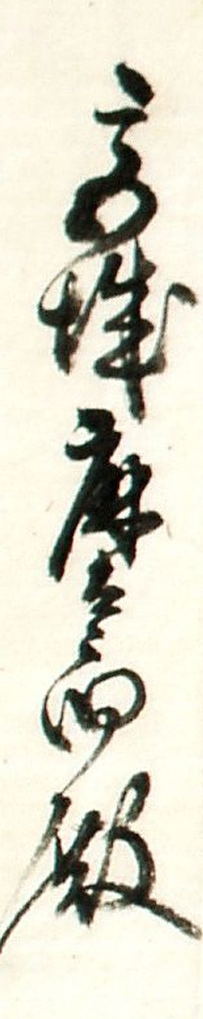宮城麻太郎殿

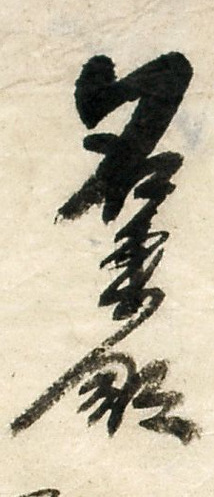名東郡
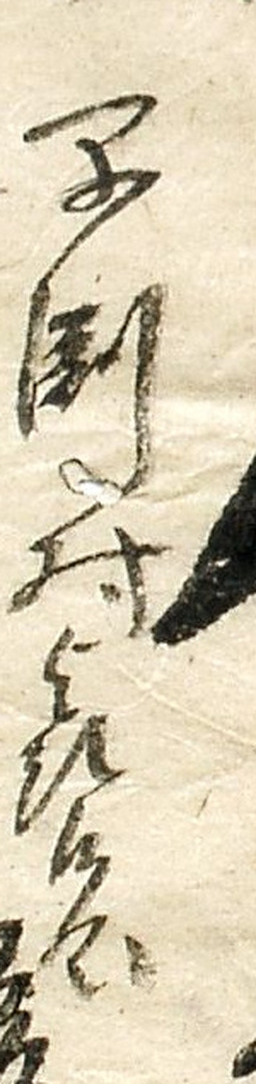早渕村与頭庄屋
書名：（早渕村福満寺虚空蔵菩薩堂修復のためおどけ軍書講談願行着添え書控）
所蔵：鳴門教育大学 Naruto University of Education
